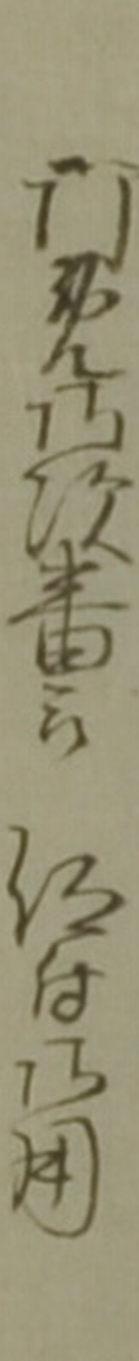御免御次番被仰付御用
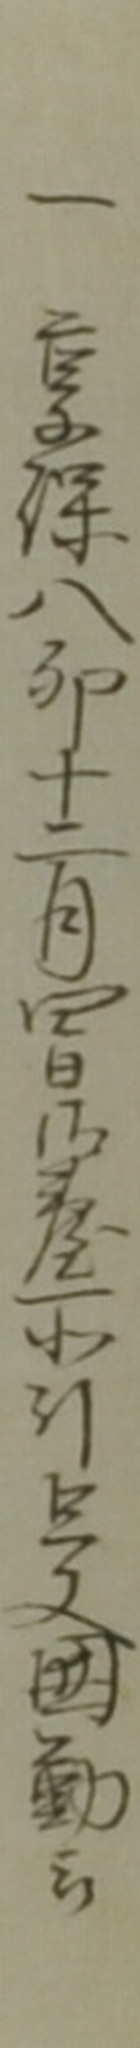一享保八卯十二月四日御台所引廻又囲勤被
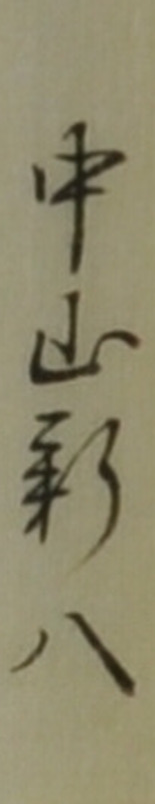中山新八
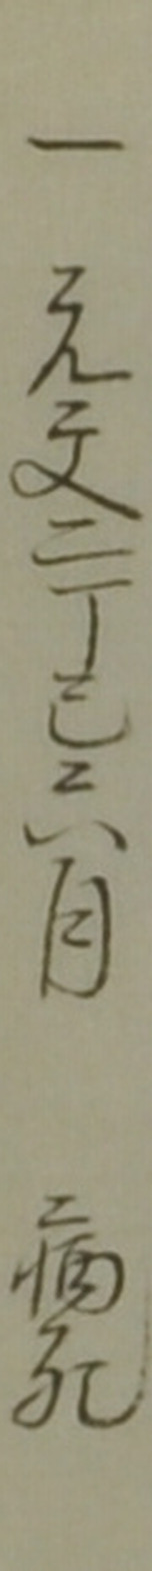一元文二丁巳六月病死
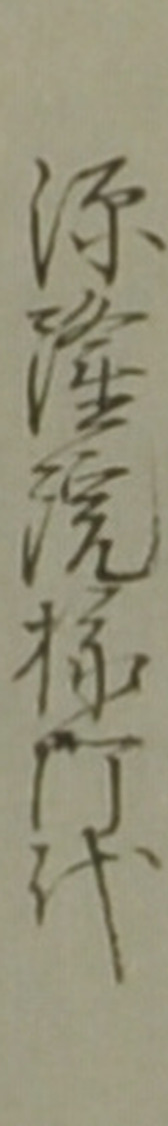源隆院様御代
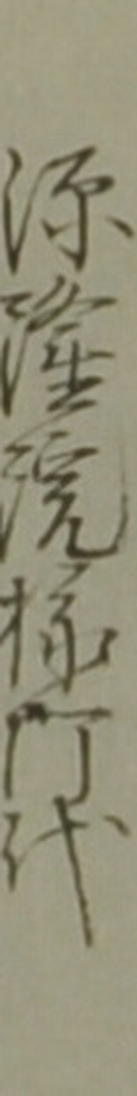源隆院様御代
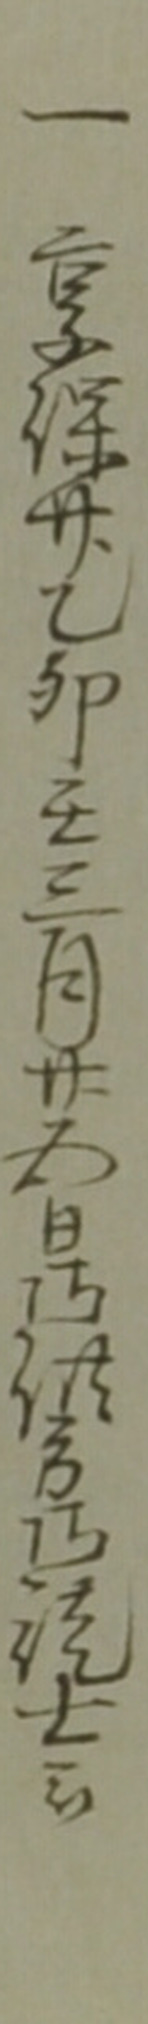一享保廿乙卯閏三月廿五日御供方御徒士被
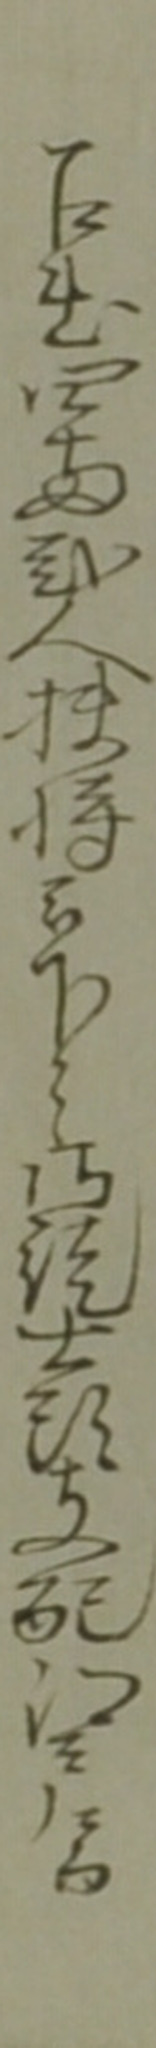召出四両弐人扶持被下之御徒士頭支配江戸ニ而
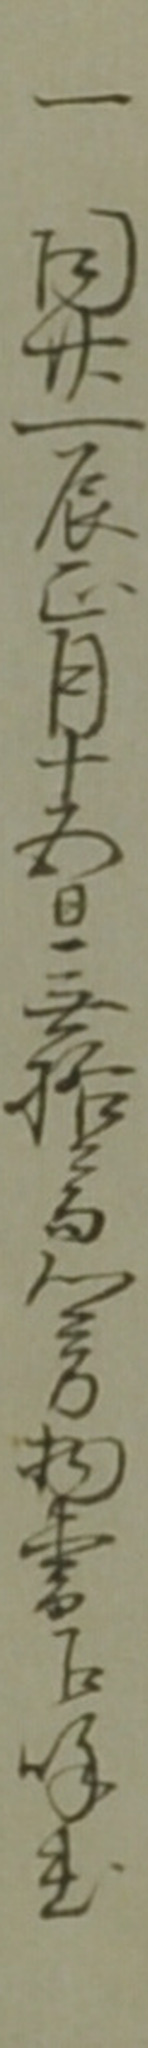一同廿一辰正月十五日無格ニ而郷方物書江呼出
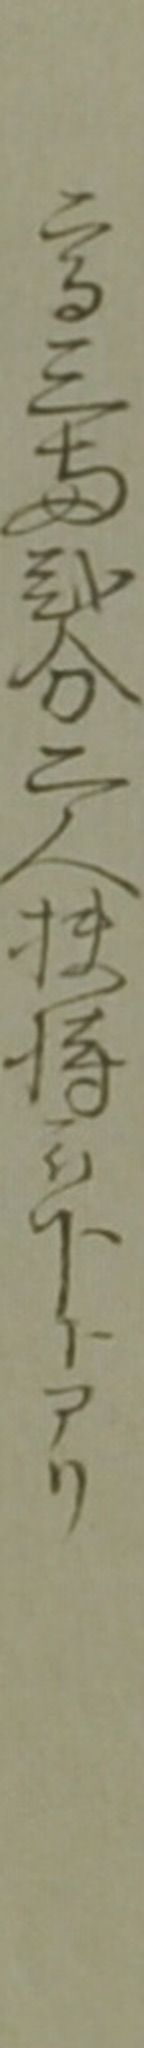高三両弐分二人扶持被下トアリ
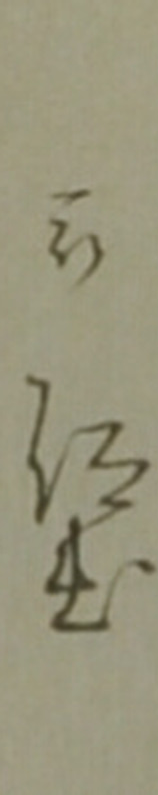被仰出
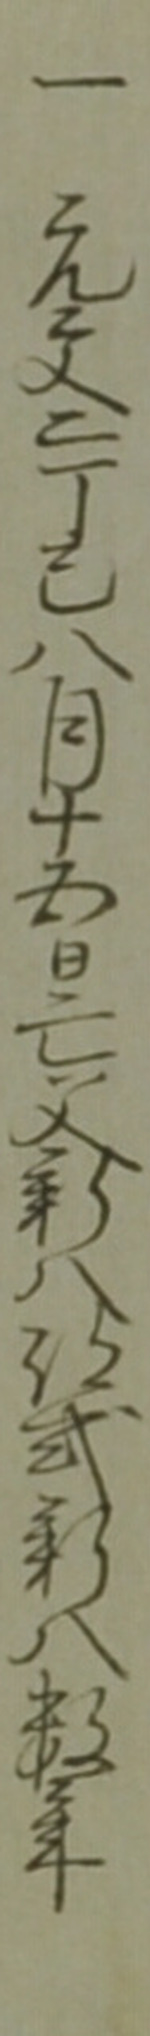一元文二丁巳八月十五日亡父新八跡式新八数年
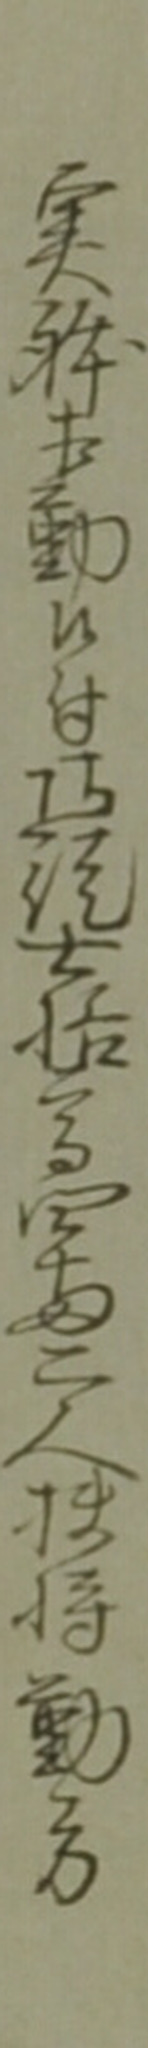実体相勤候付御徒士格高四両二人扶持勤方
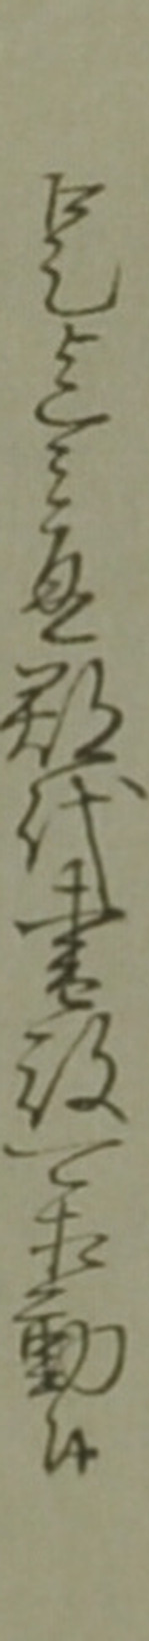是迄之通郡代書役可相勤候
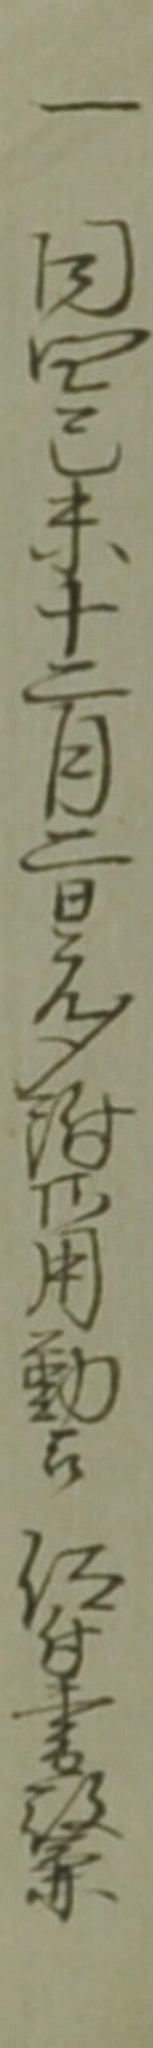一同四己未十二月二日元〆附御用勤被仰付書役兼
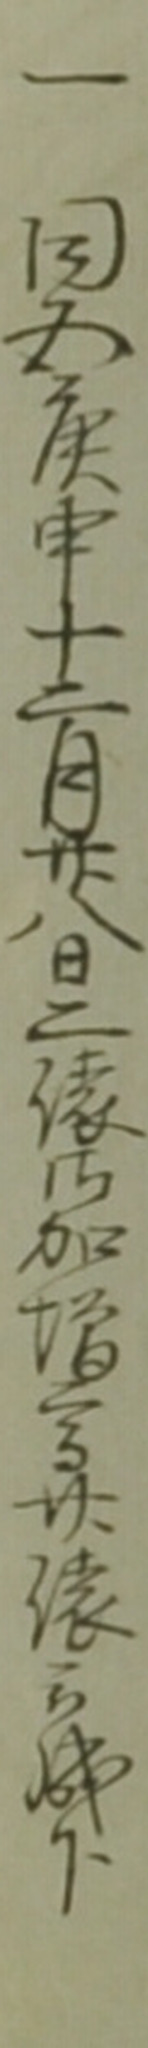一同五庚申十二月廿八日二俵御加増高廿俵被成下
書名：無足廃家（弐）
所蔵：伊那市立高遠町図書館・合同会社AMANE
